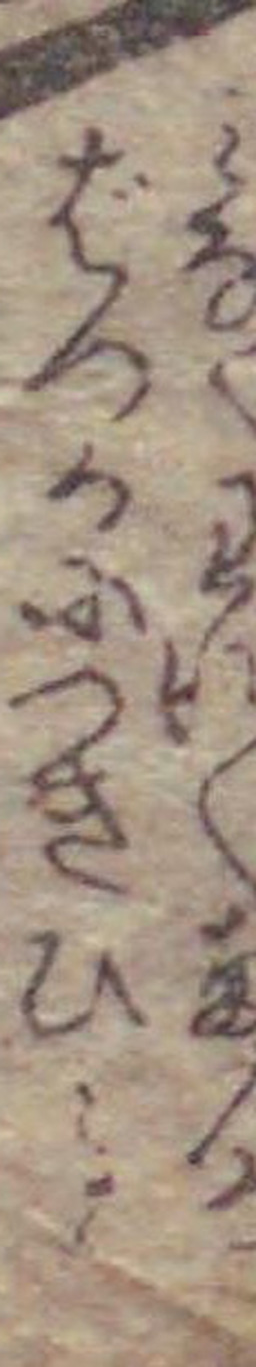ばつかにつきひ
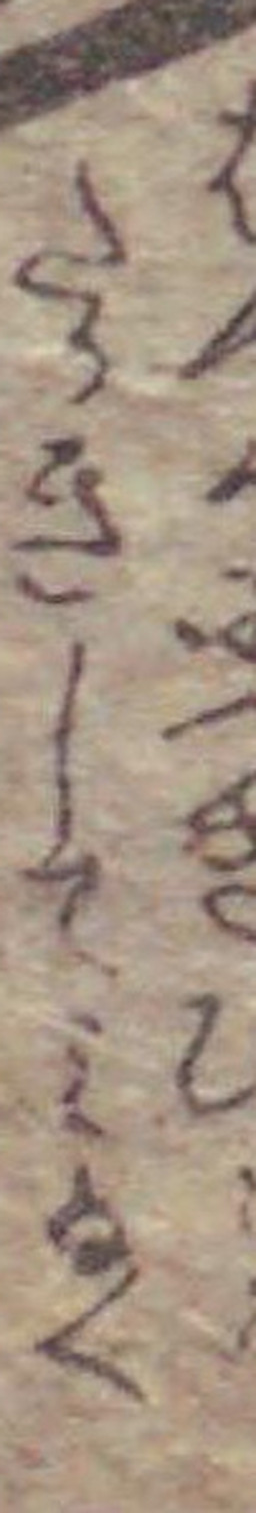たゝきしてみなへ

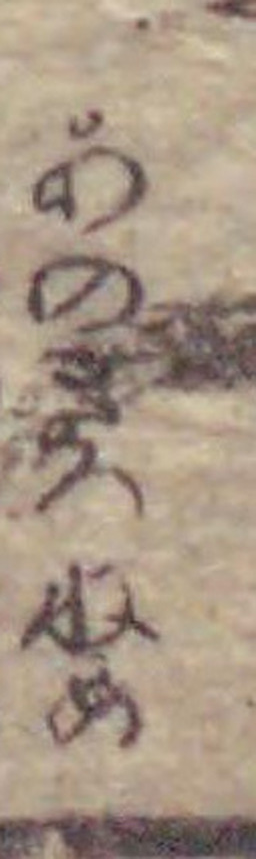あのきつねめ
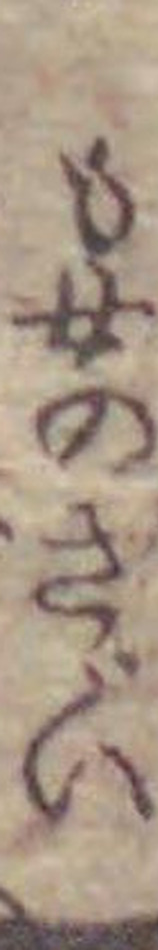も女のきらい
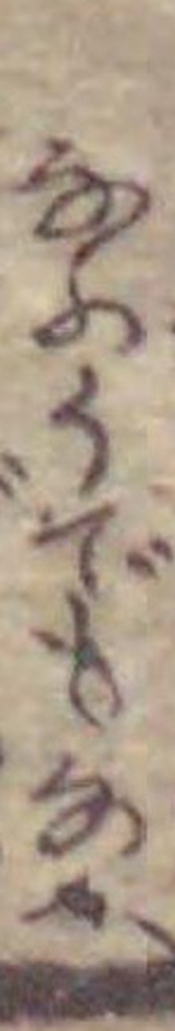なふうでもなへ
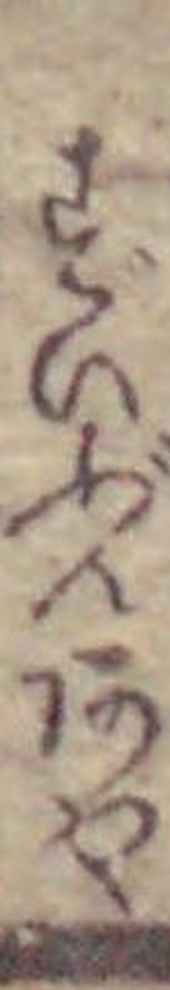ずいｂんあや
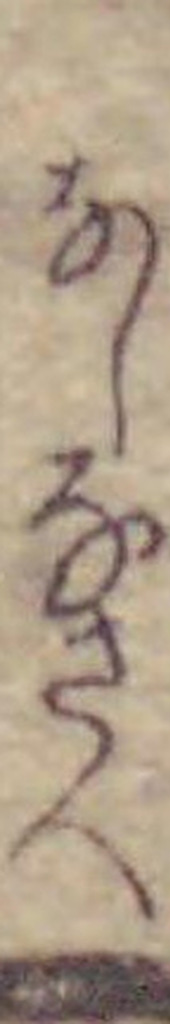なしなさへ
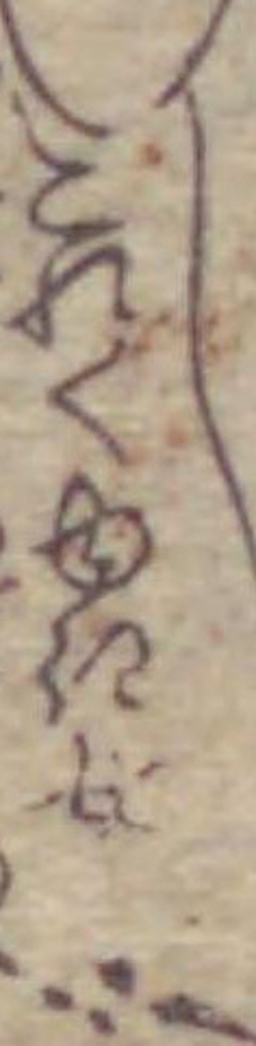これ〳〵ゆき女
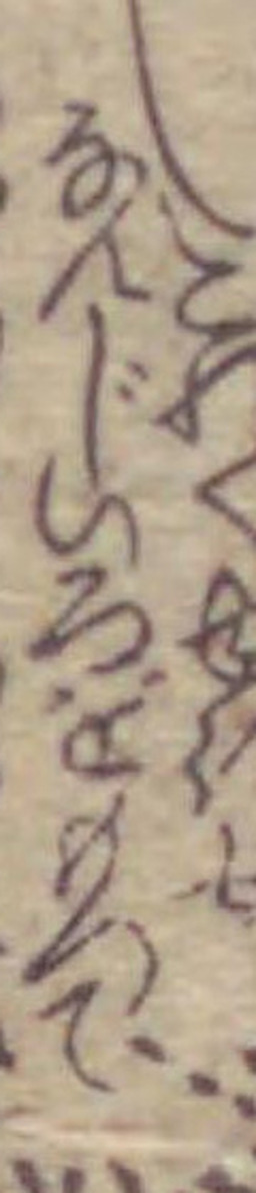なんじいろをもつて
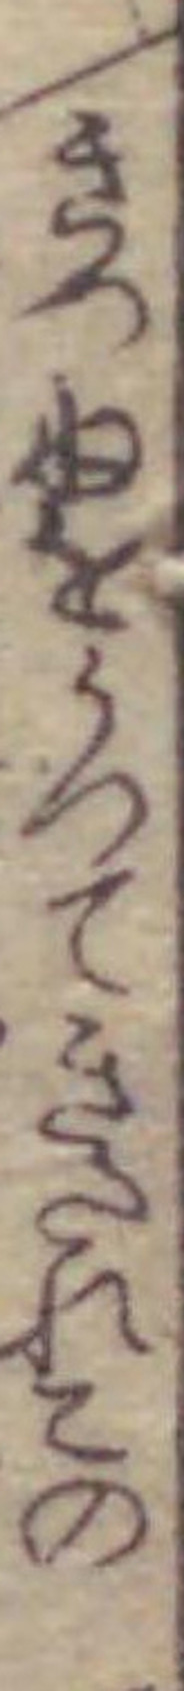きつぬをうつてきたれこの
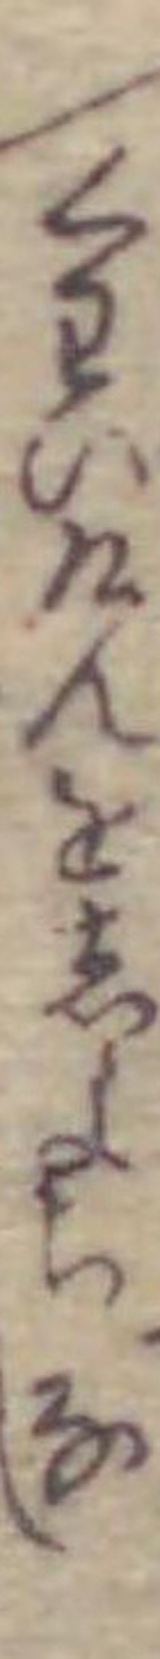くわいけんをしよちなし
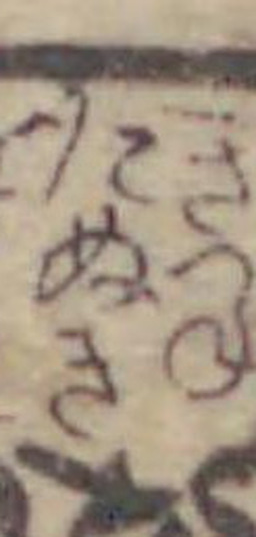たぬき
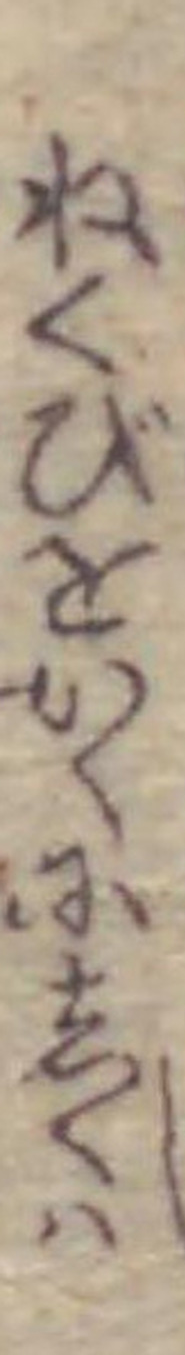ねくびをかくにしくは
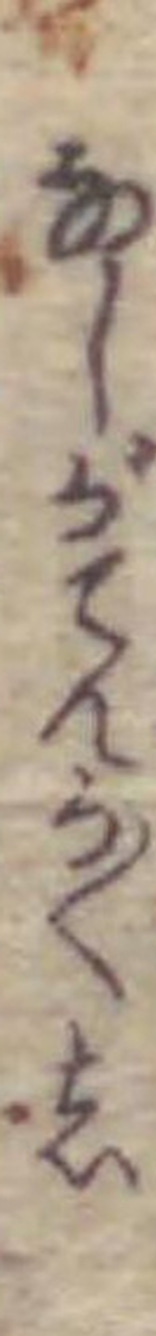なしがてんか〳〵し
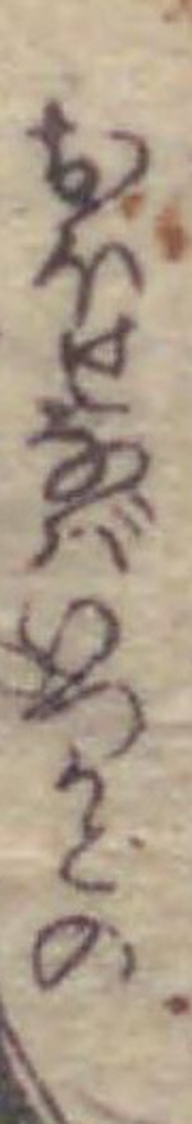おほせなばいつかどの
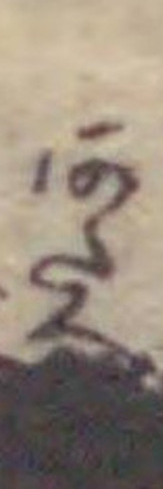あたへ
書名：化物仲間破 : 2巻
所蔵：国立国会図書館 National Diet Library, JAPAN
